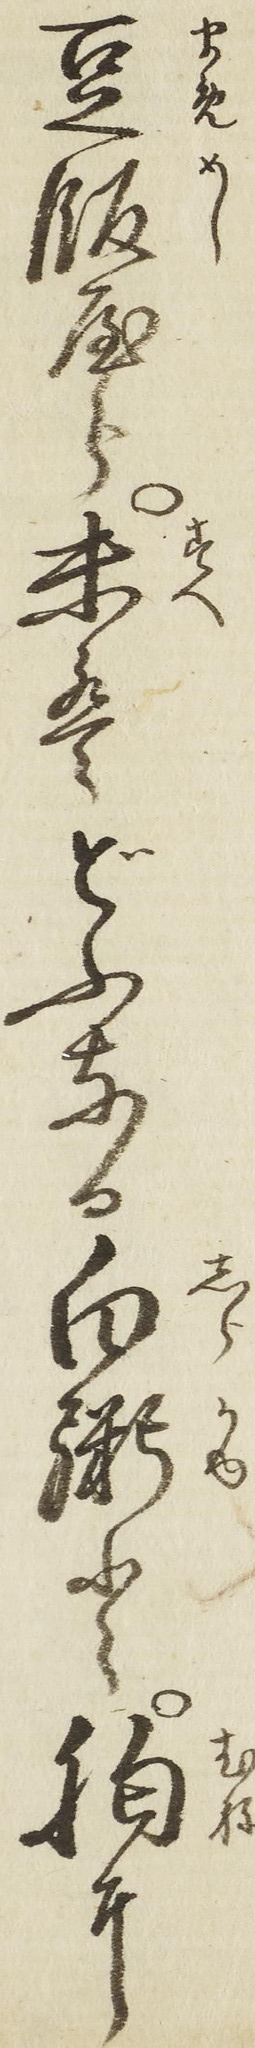豆飯やら。末はどふなる白粥と。胸に
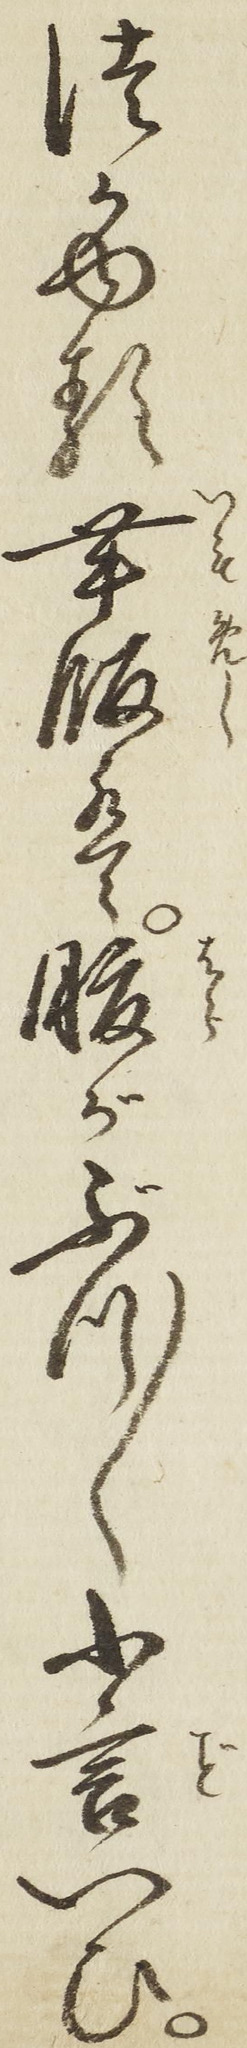つかゆる芋飯は。腹がぶつ〳〵小言いひ。
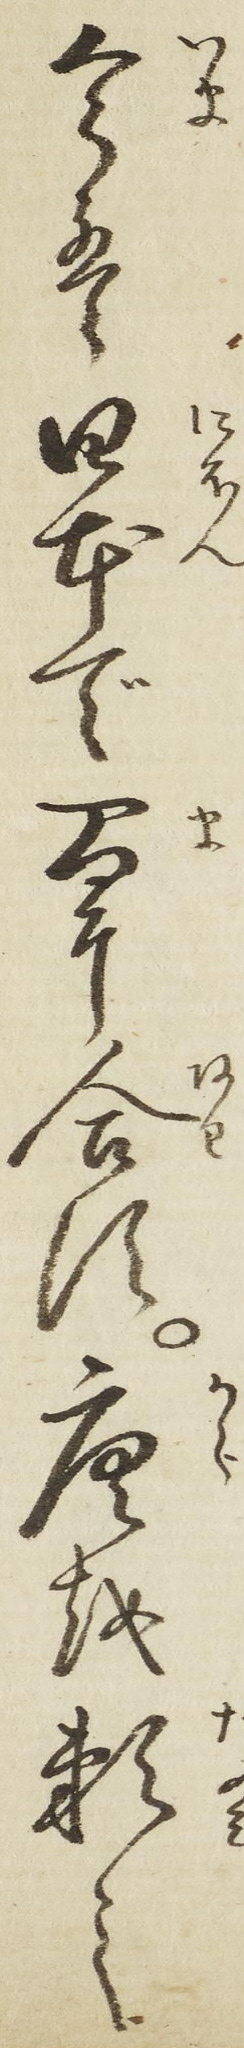今は日本で間に合す。唐を頼之

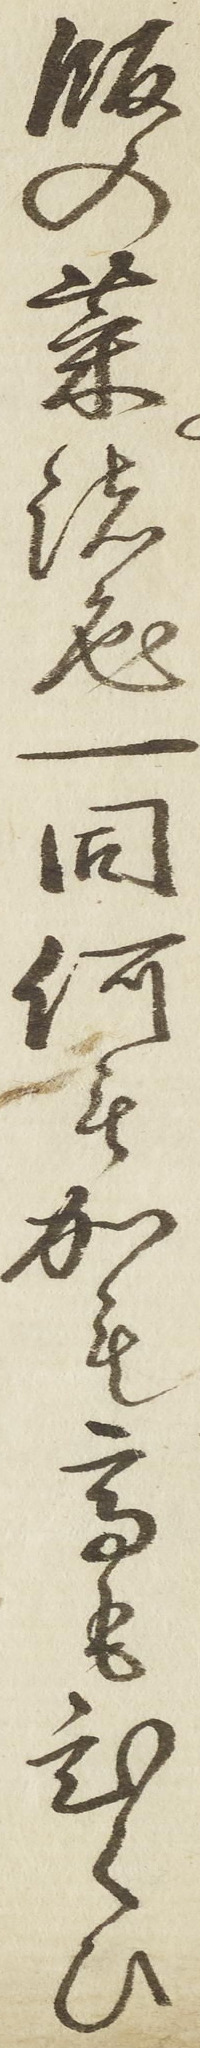飯の菜。諸色一同何もかも高もきくひ
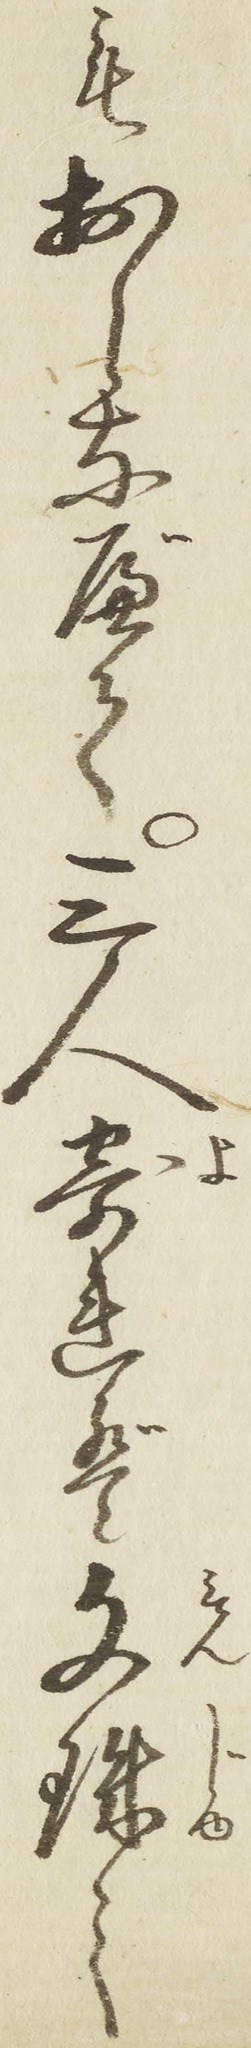もおしなべて。三人寄れば文殊之
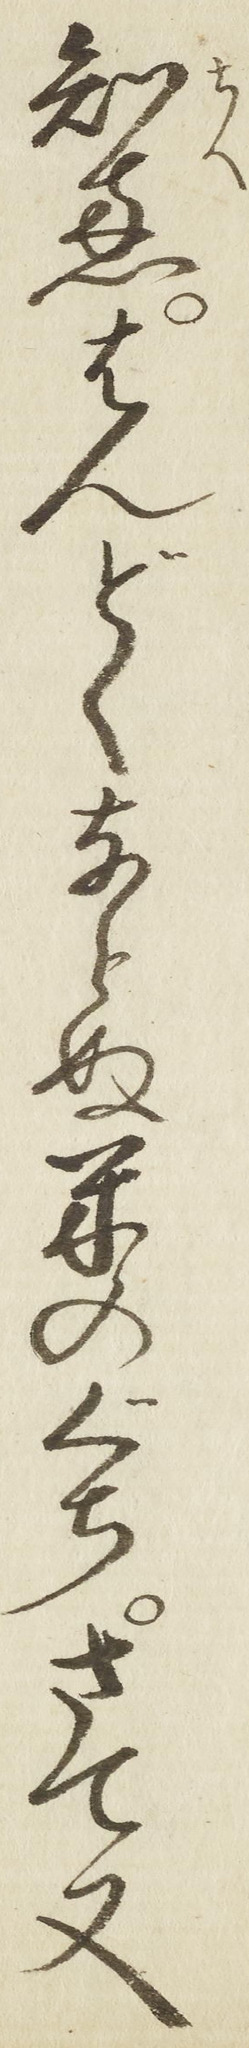智恵。はんどくならぬ米のぐち。さて又
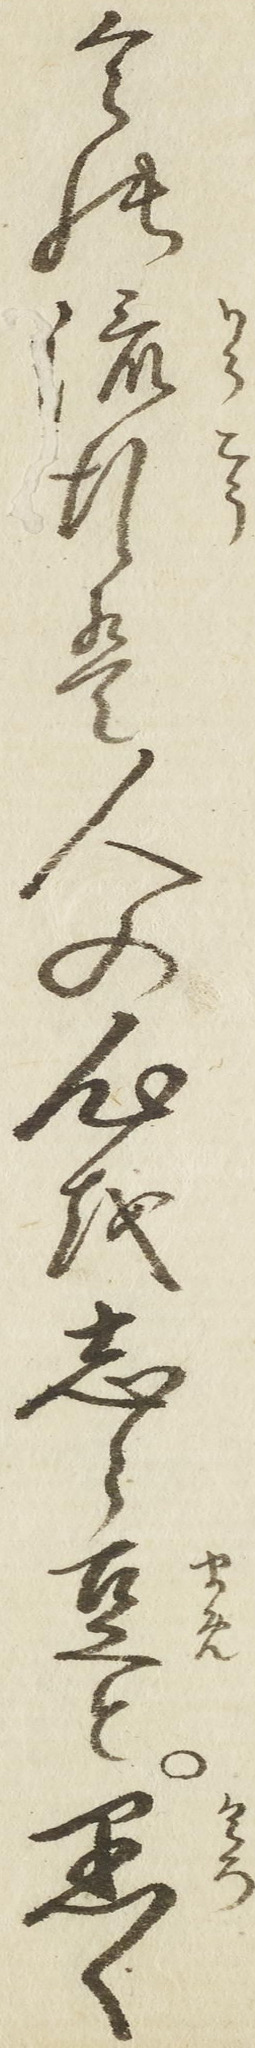今の流行は人の心をしら豆と。黒く
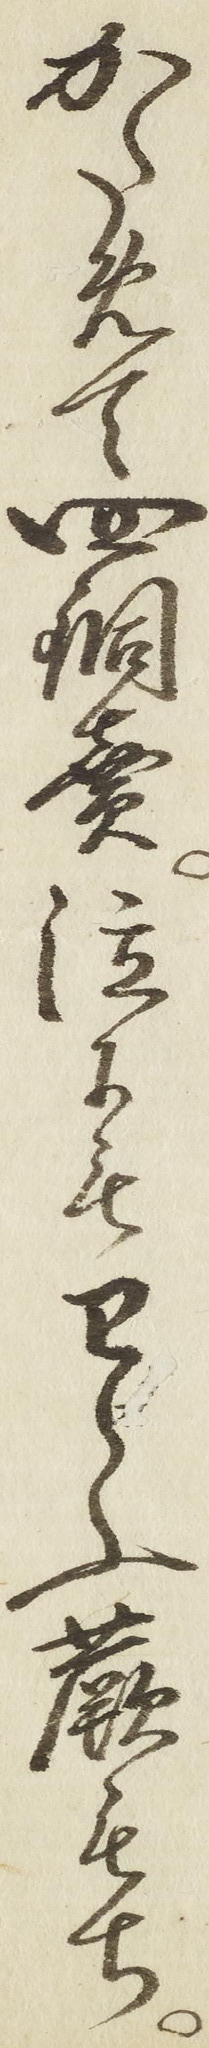かためて四銅売。泣にもわらふ蕨もち。
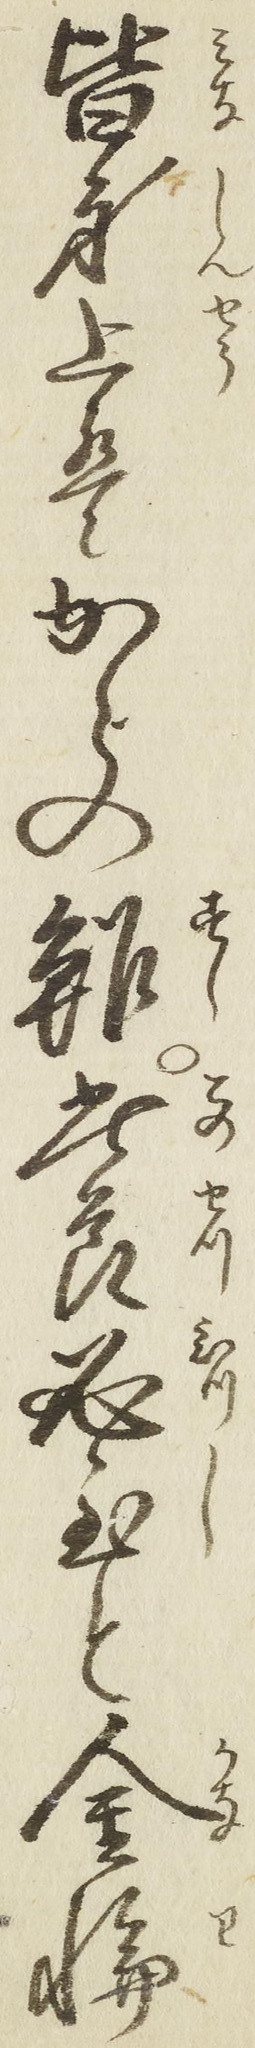皆身上はからの鮓。此節必至と金輪
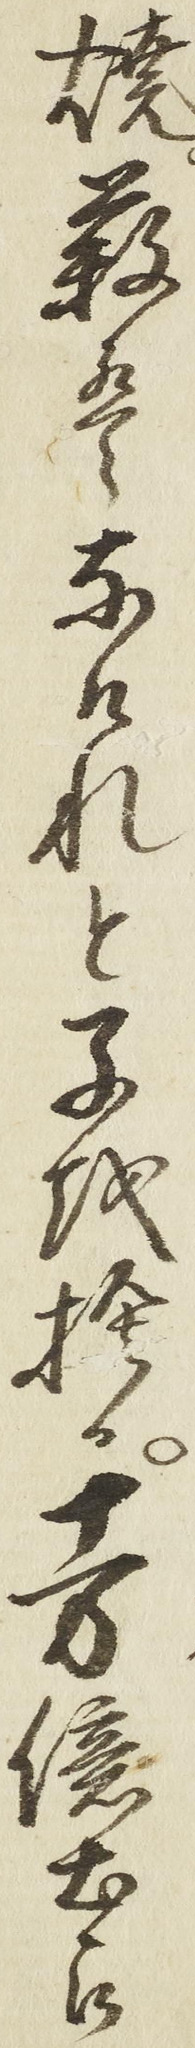焼。藪はなけれと子を捨る。十万億土江
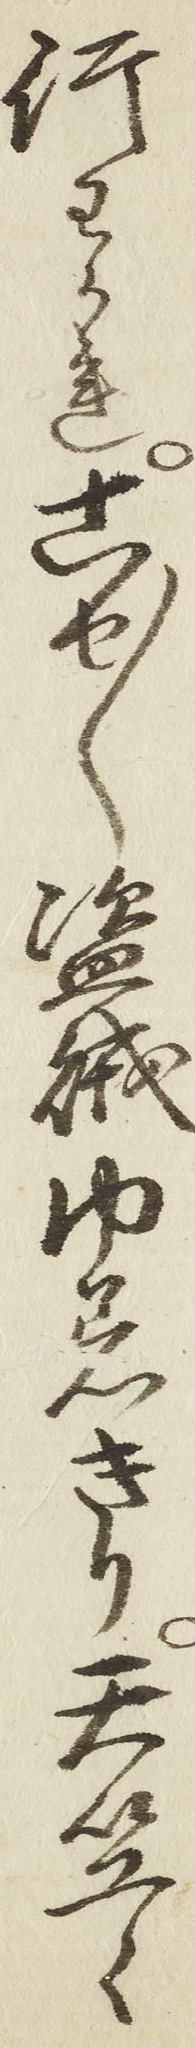行わかれ。こせ〳〵盗賊巾着きり。天竺く
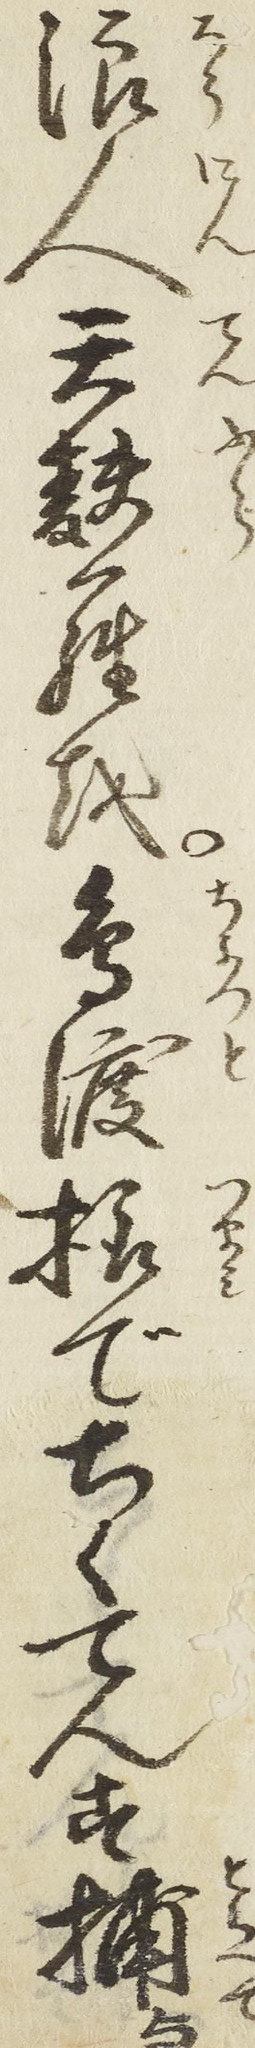浪人天麩羅を。鳥渡撮でちくてんす捕と
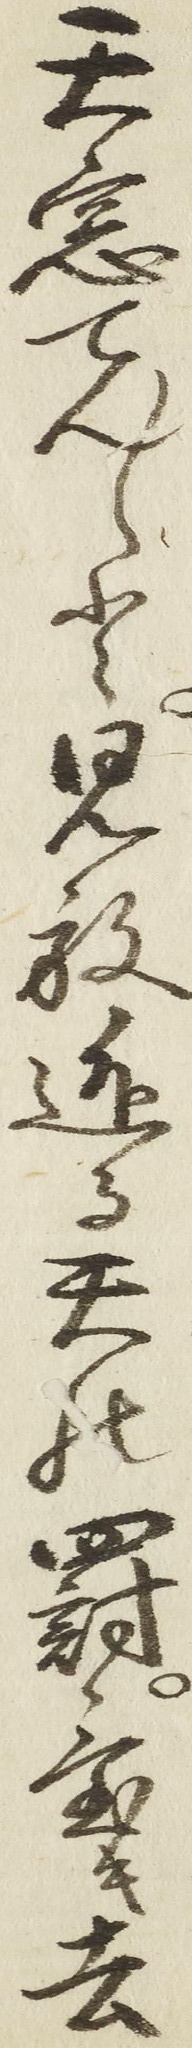天窓てん〳〵と。見放逃る天の罰。置キ去
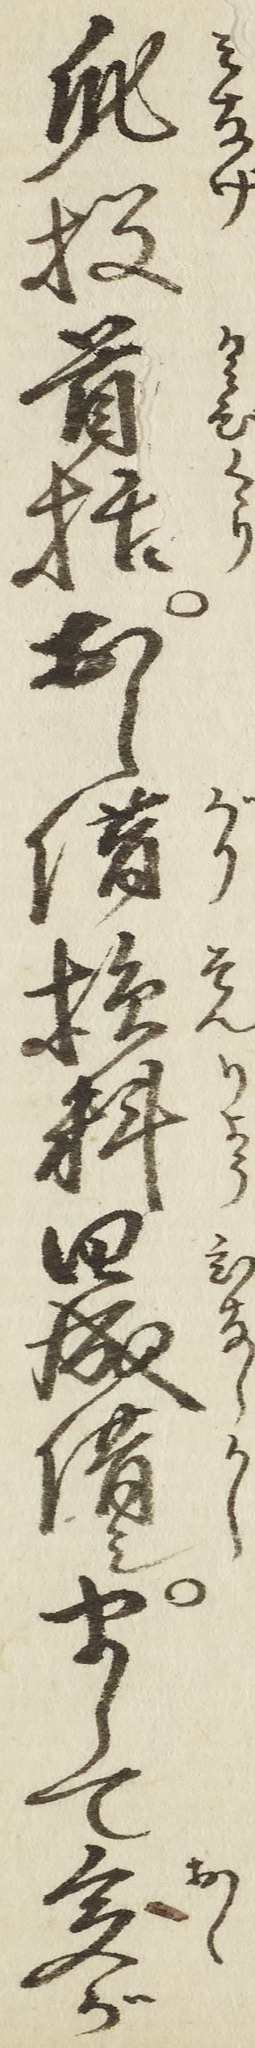身投首括。おし借損料日成借シ。まして多が
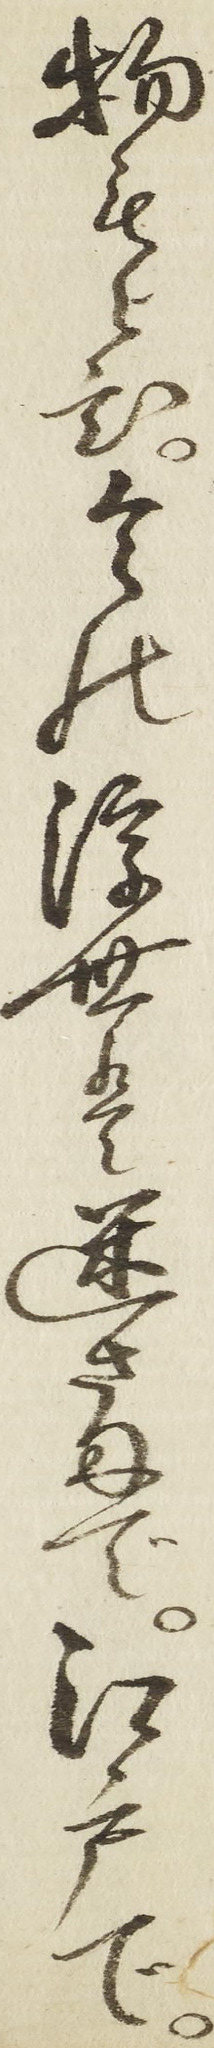物もらひ。今の浮世は迷さまで。江戸で。
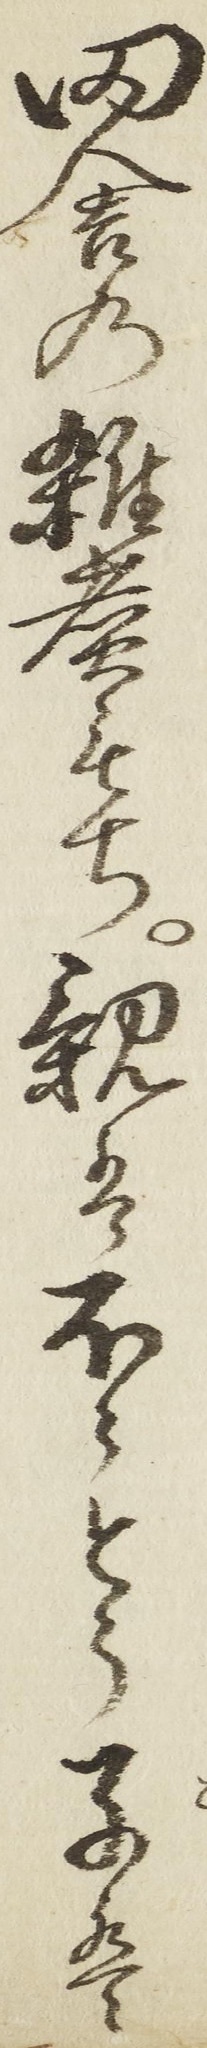田舎の雑煮もち。親はほうとう子は
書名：天保佐久　滑稽茶利集記
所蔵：東京大学地震研究所図書室 Earthquake Research Institute Library, The University of Tokyo, JAPAN
